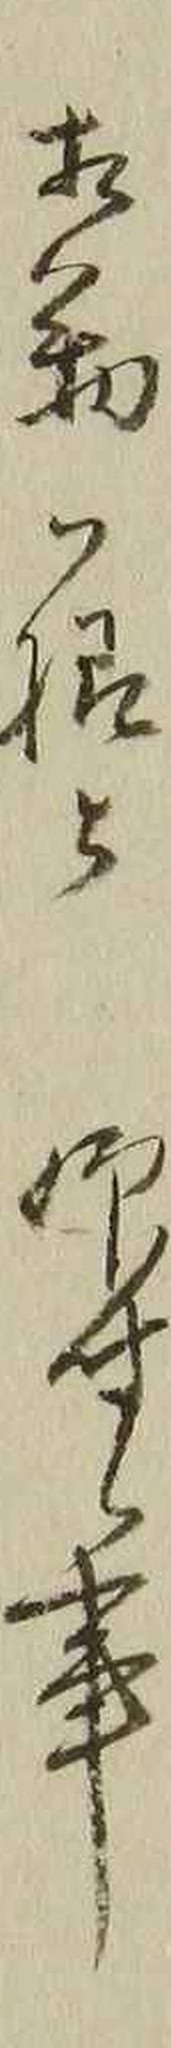相勤候様被仰付候事
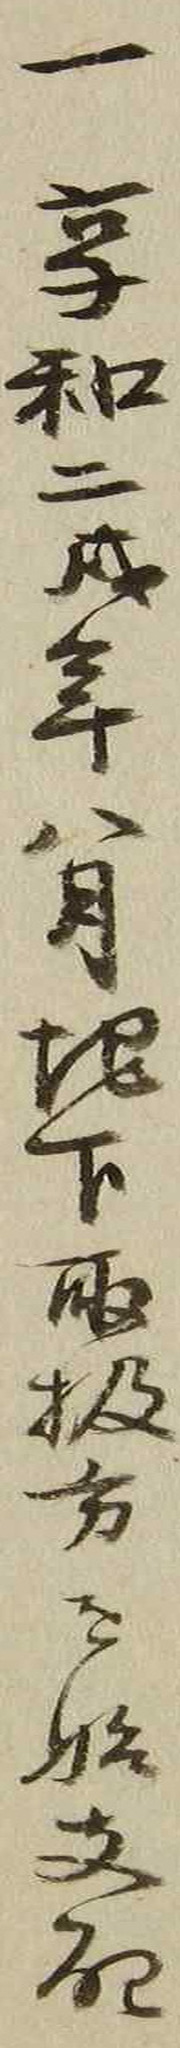一享和二戌年八月地下取扱方を始支配
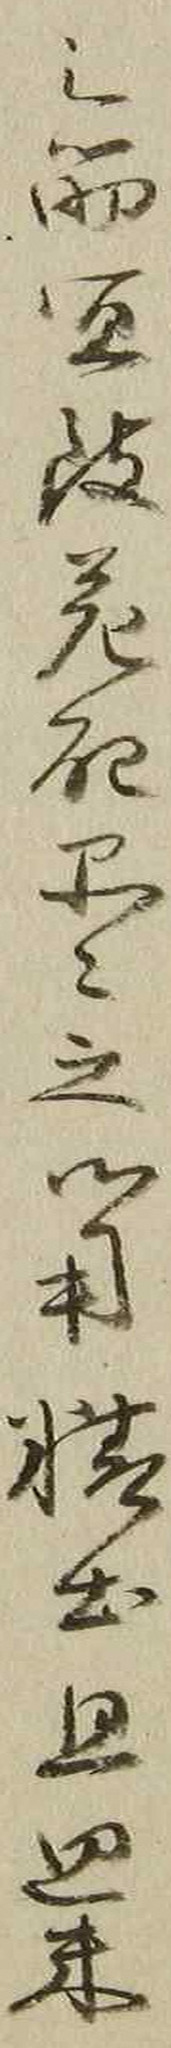之筋宜致差配品々之御用精出廻米
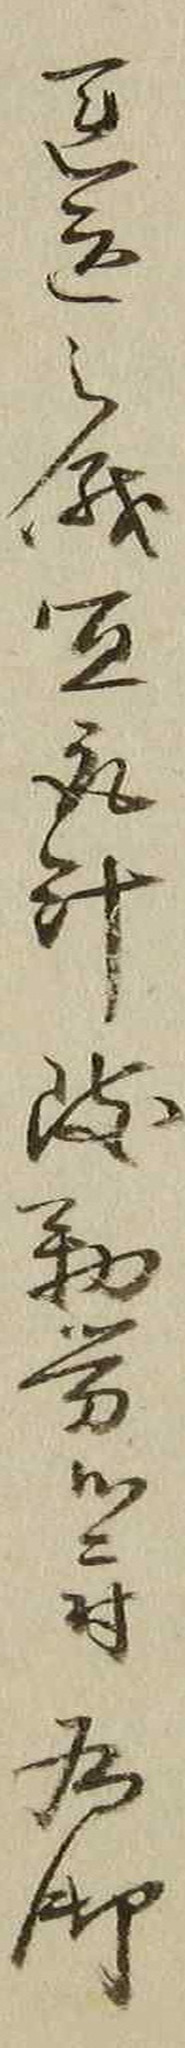運送之儀宜取計致勤労候ニ付為御
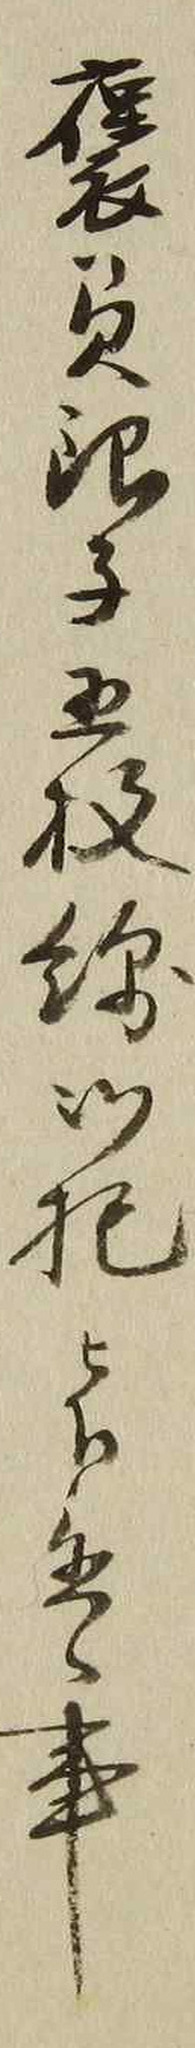褒美銀子五枚綿弐把被下置候事
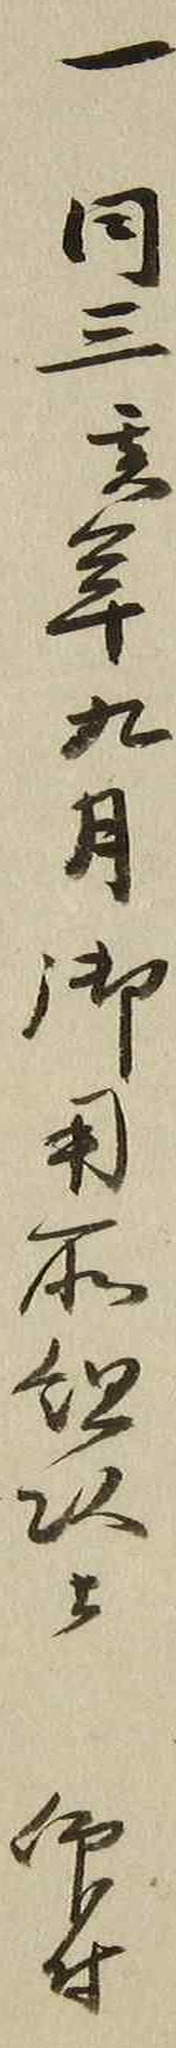一同三亥年九月御用所組頭被仰付
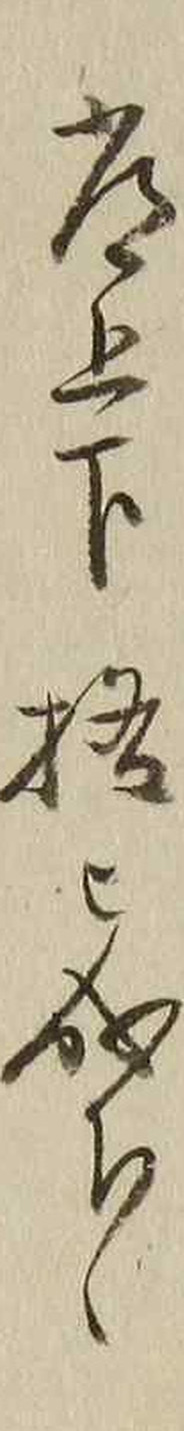常上下格被成下候
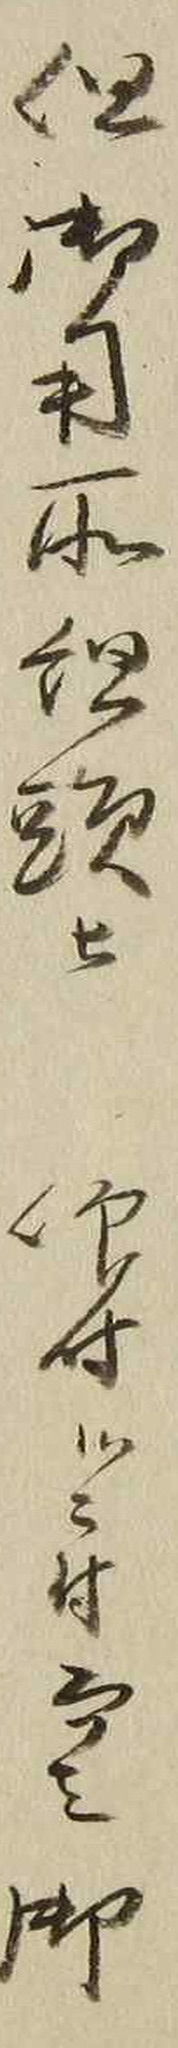但御用所組頭被仰付候ニ付而者御
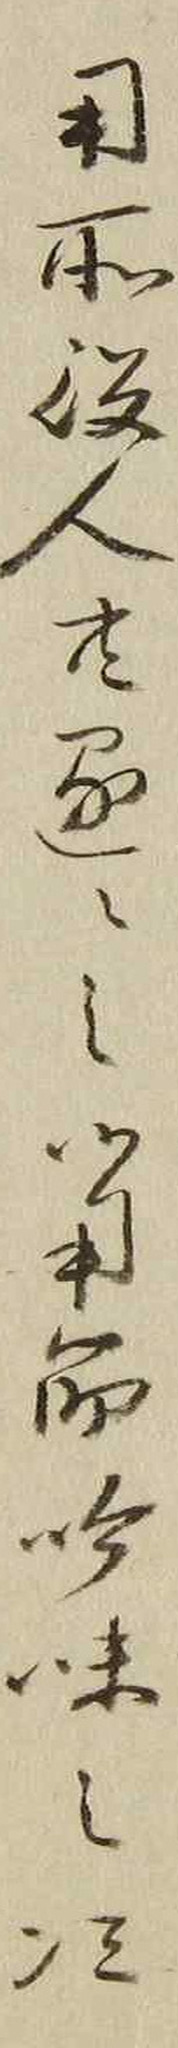用所役人共逐々之御用筋吟味之次
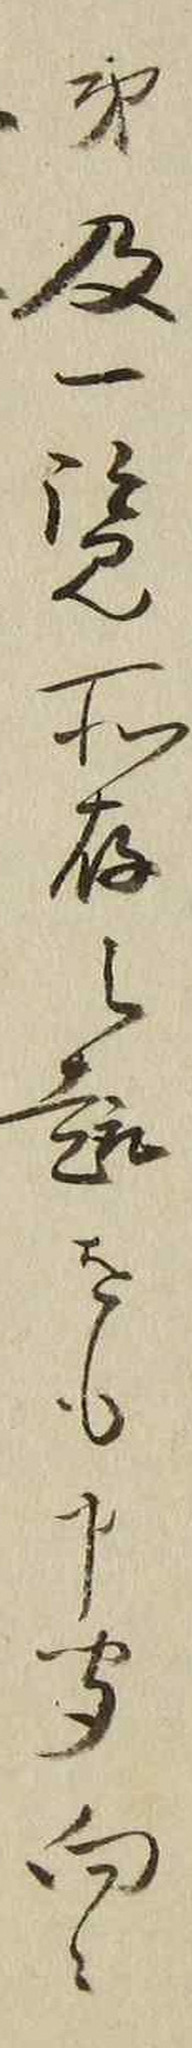弟及一覧所存之趣をも申聞向々
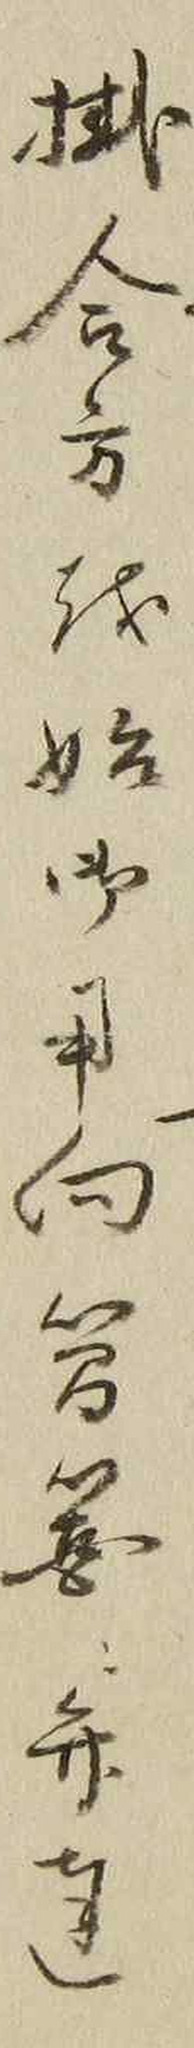掛合方を始御用向簡箇ニ弁達
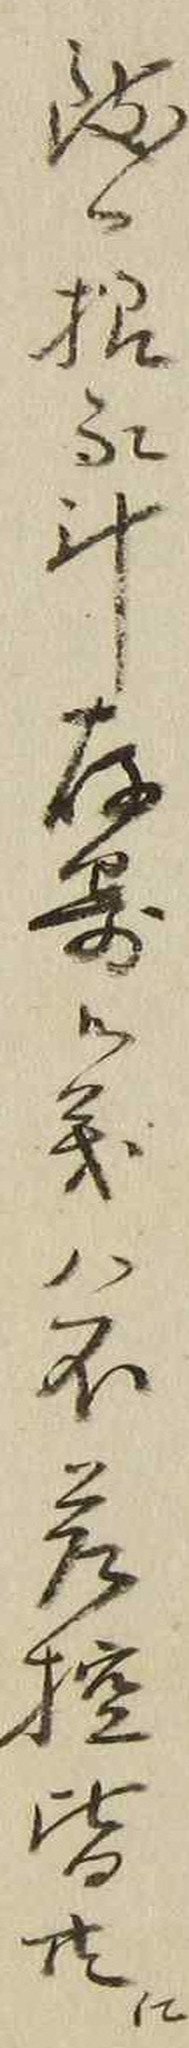致候様取斗存寄候義ハ不差控皆共に
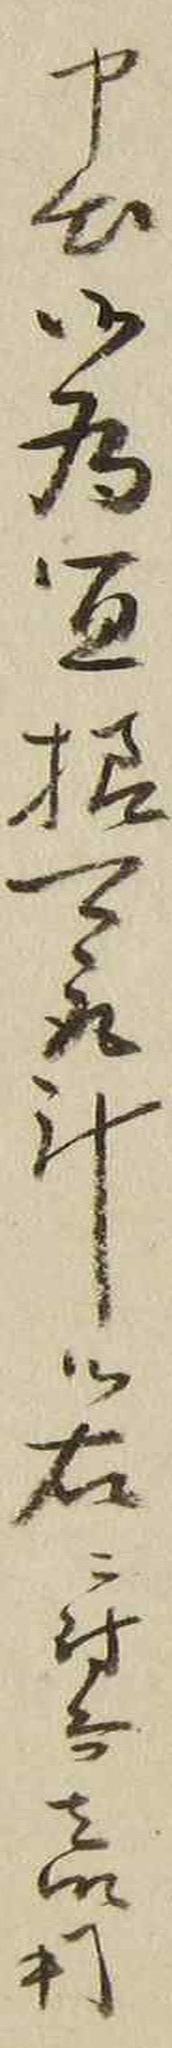申出御為宜様可取計候右ニ付而者御用
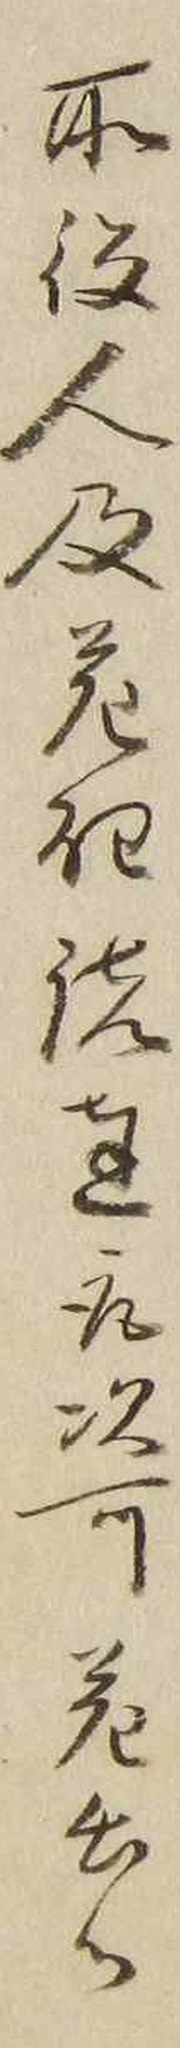所役人及差配諸達取次可差出候

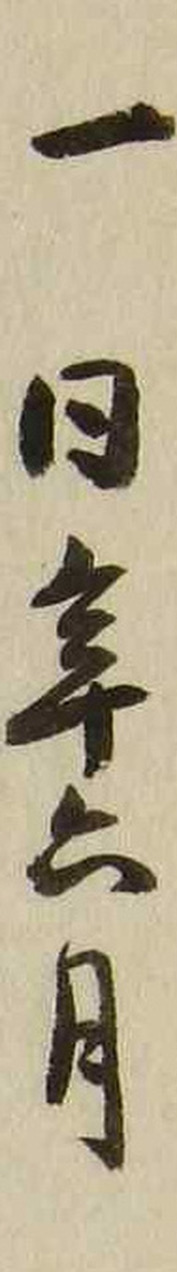一同年六月
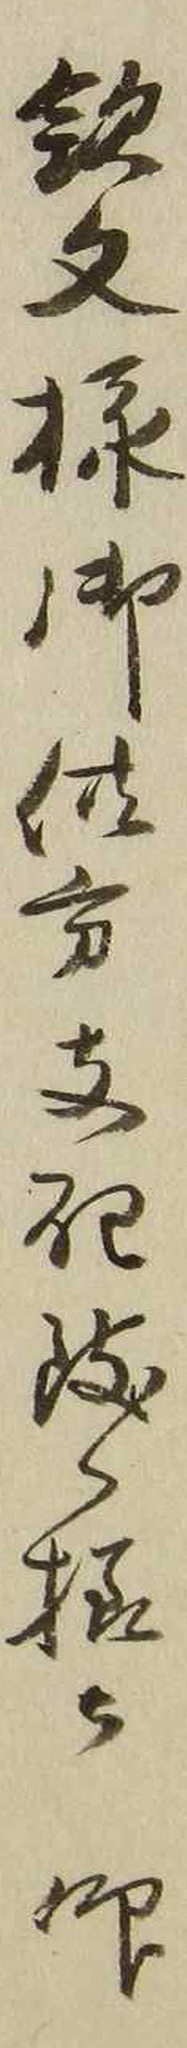欽文様御供方支配致候様被仰
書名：諸士系譜　巻之261　あ之部14
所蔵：会津若松市立会津図書館
